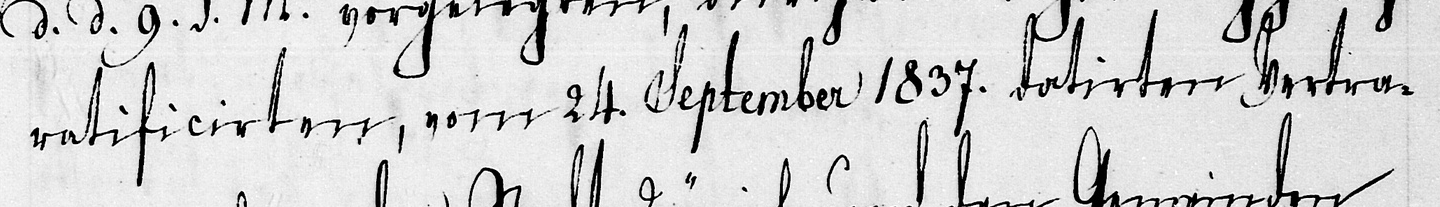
ratificirten, vom 24. September 1837. datirten Vertra¬
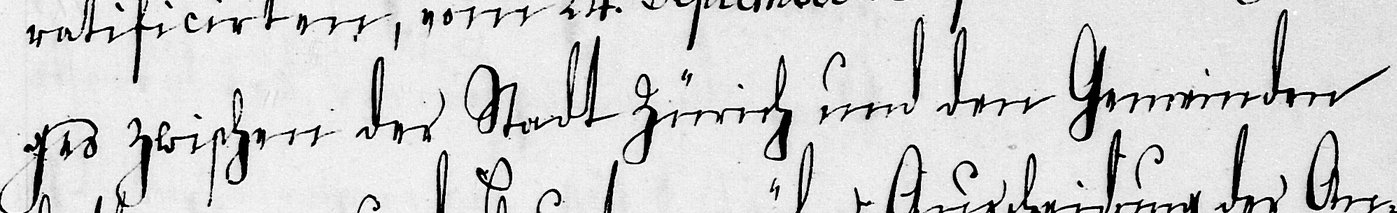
ges zwischen der Stadt Zürich und den Gemeinden
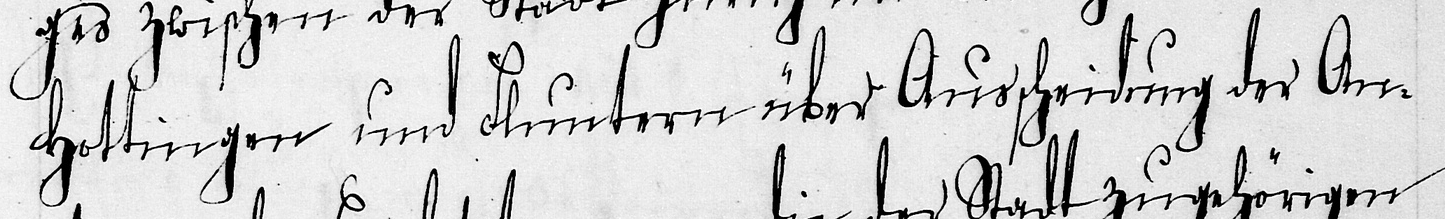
Hottingen und Fluntern über Ausscheidung der An¬
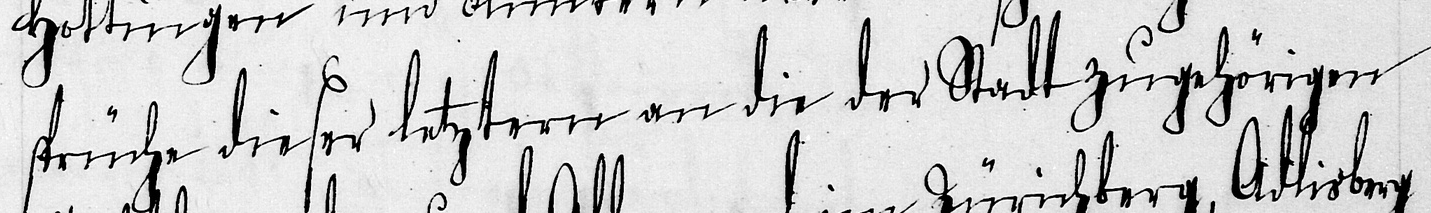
sprüche dieser letztern an die der Stadt zugehörigen
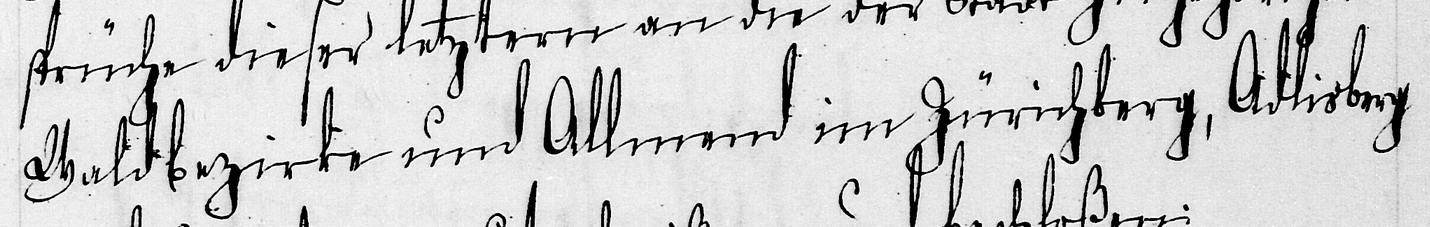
Waldbezirke und Allmend im Zürichberg, Adlisberg
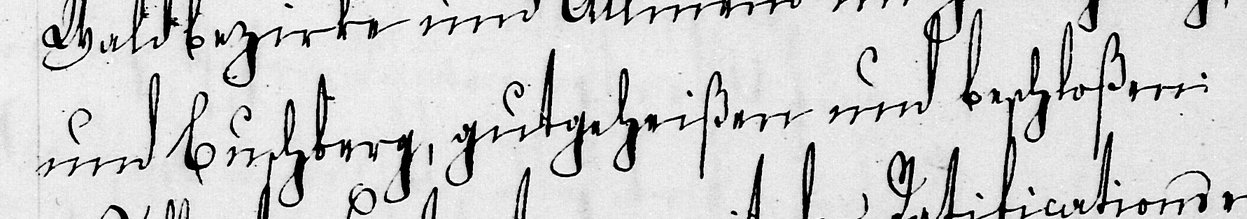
und Buchberg, gutgeheißen und beschloßen:
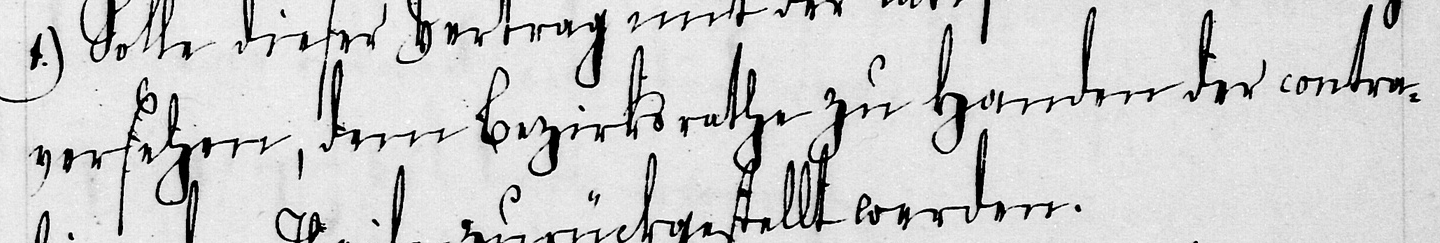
versehen, dem Bezirksrathe zu Handen der contra¬
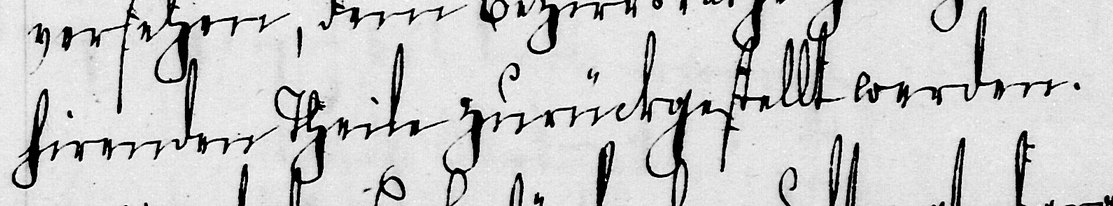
hirenden Theile zurückgestellt werden.
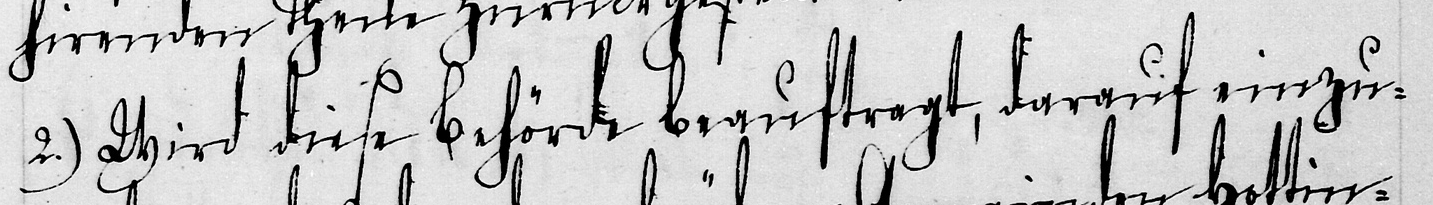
2.) Wird diese Behörde beauftragt, darauf einzu¬
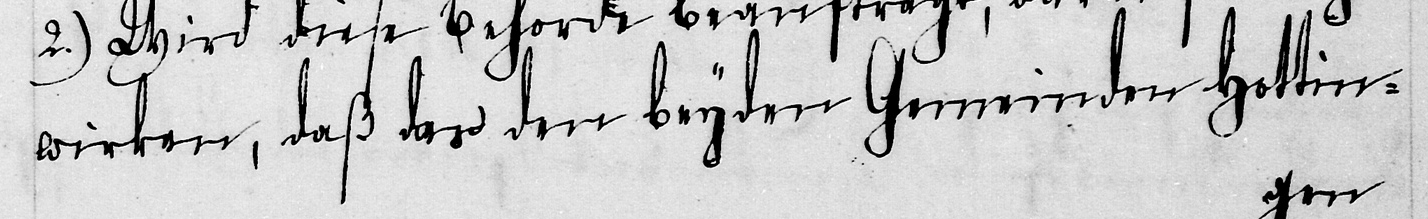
wirken, daß das den beyden Gemeinden Hottin-
